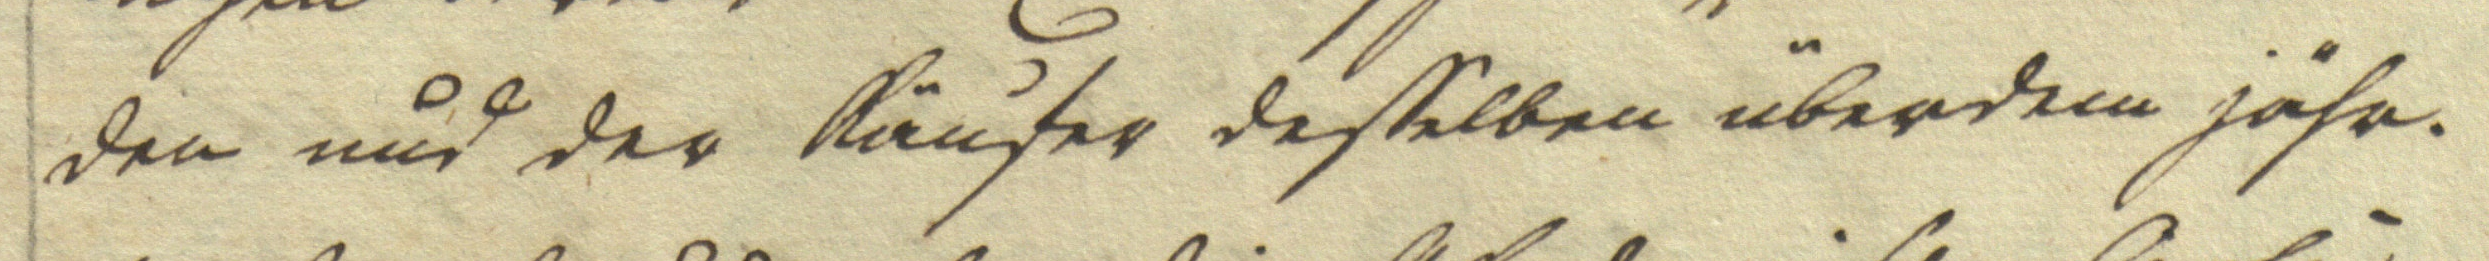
den und der Käufer desselben überdem jähr¬
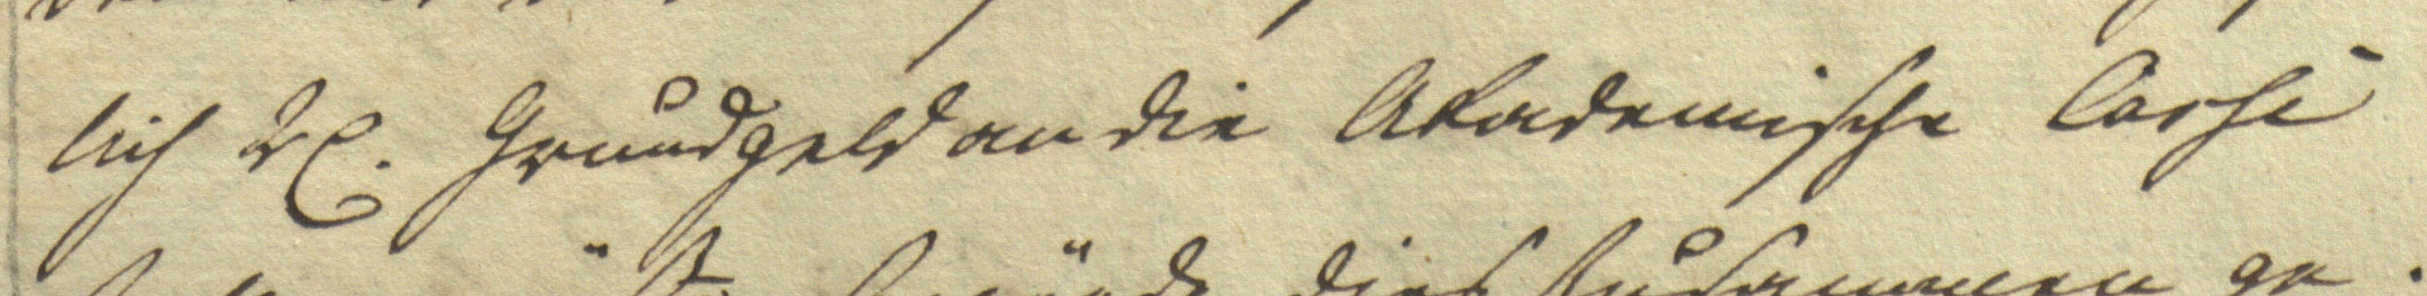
lich 2 l. Grundgeld an die Akademische Casse
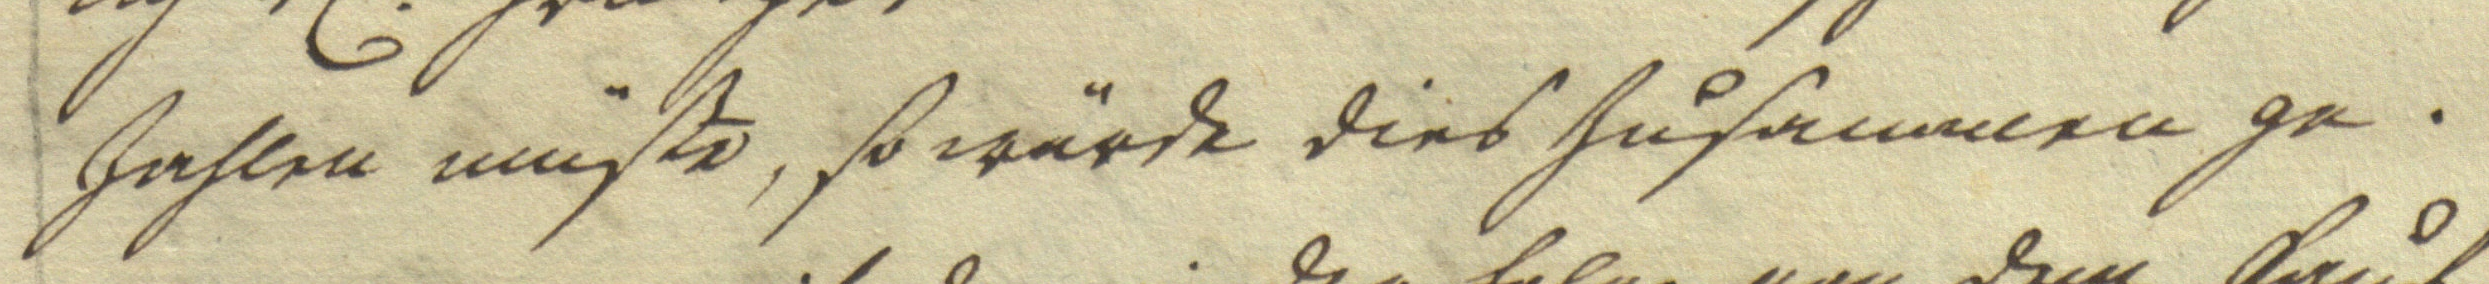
zahlen müßte, so würde dies zusammen ge¬
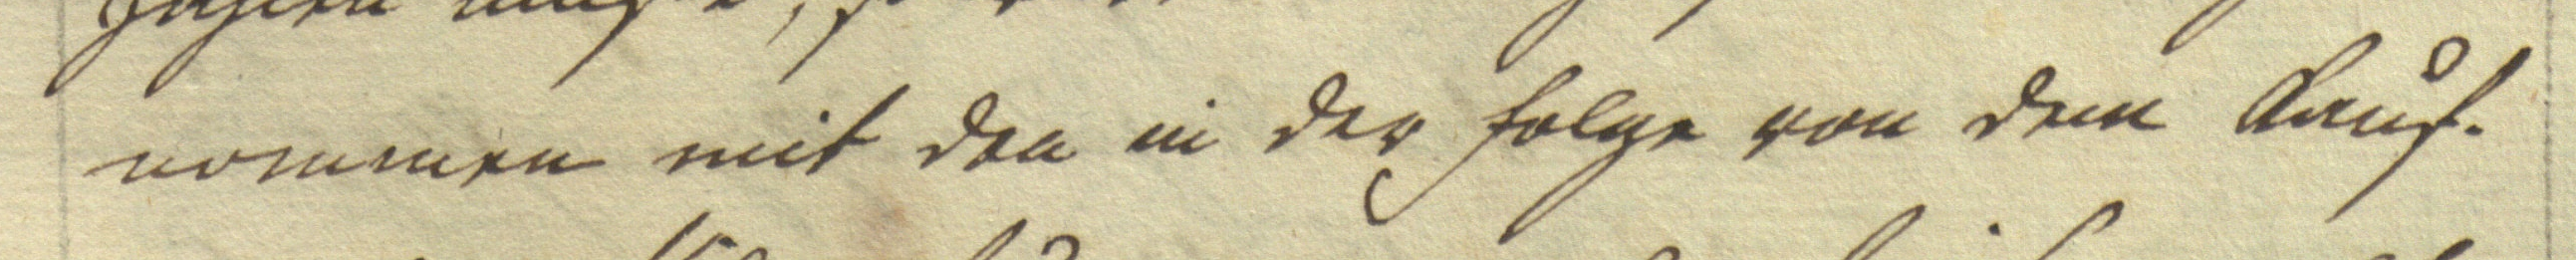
nommen mit den in der Folge von dem Kauf¬
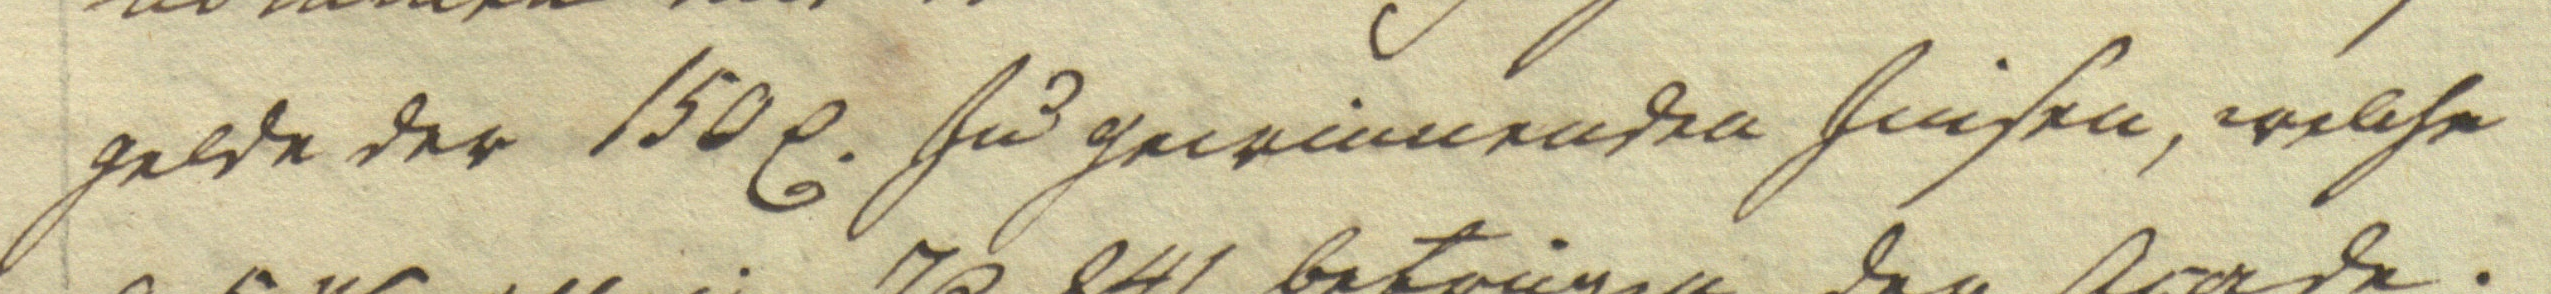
Gelde der 150 l. zu gewinnenden Zinsen, welche
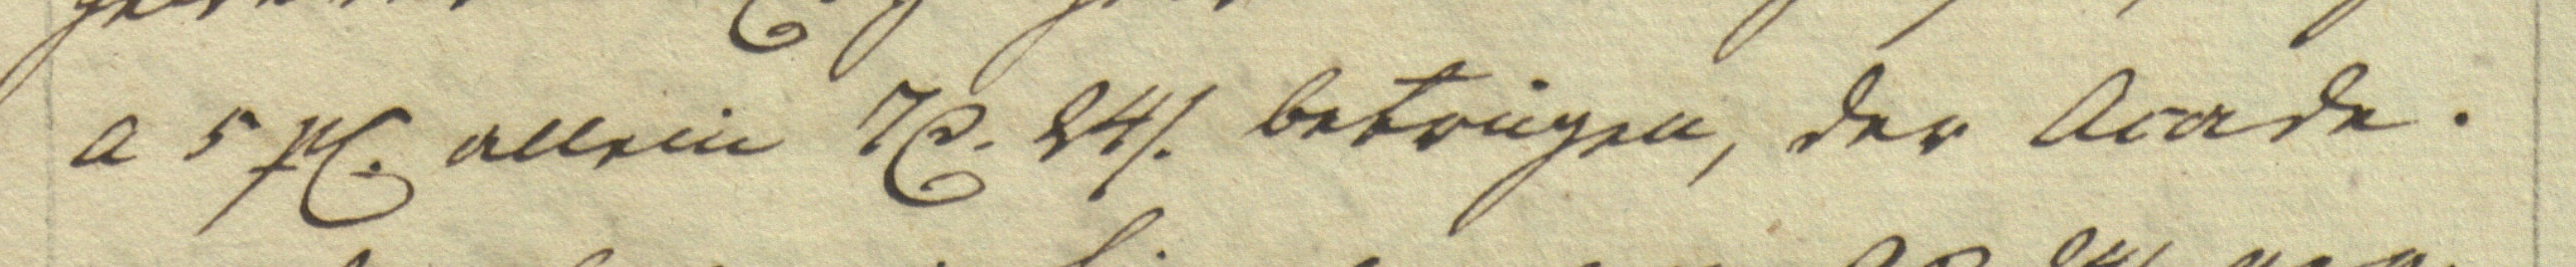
a 5 pl. allein 7 l. 24 s. betrügen, der Acade¬
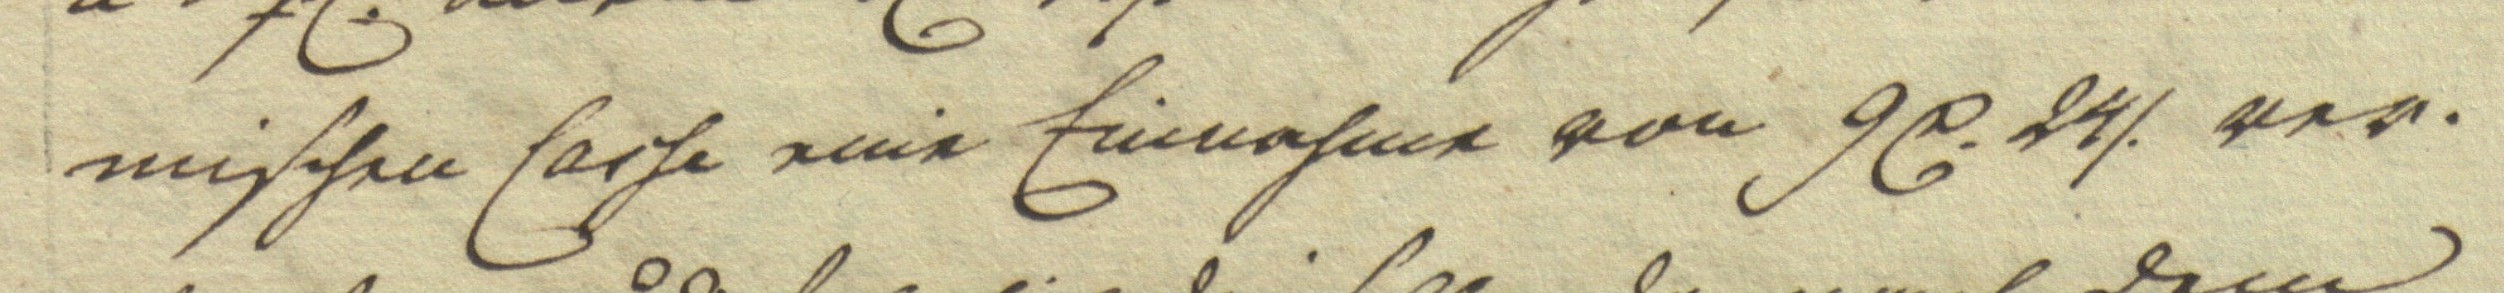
mischen Casse eine Einnahme von 9 l. 24 s. ver¬
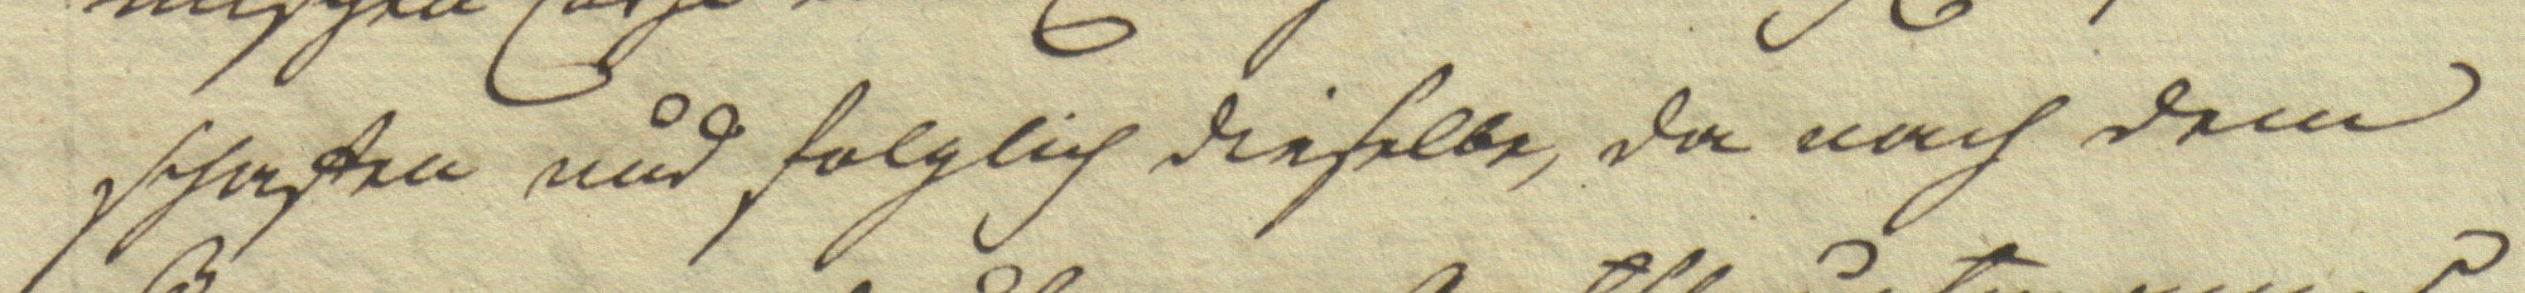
schaffen und folglich dieselbe, da nach dem
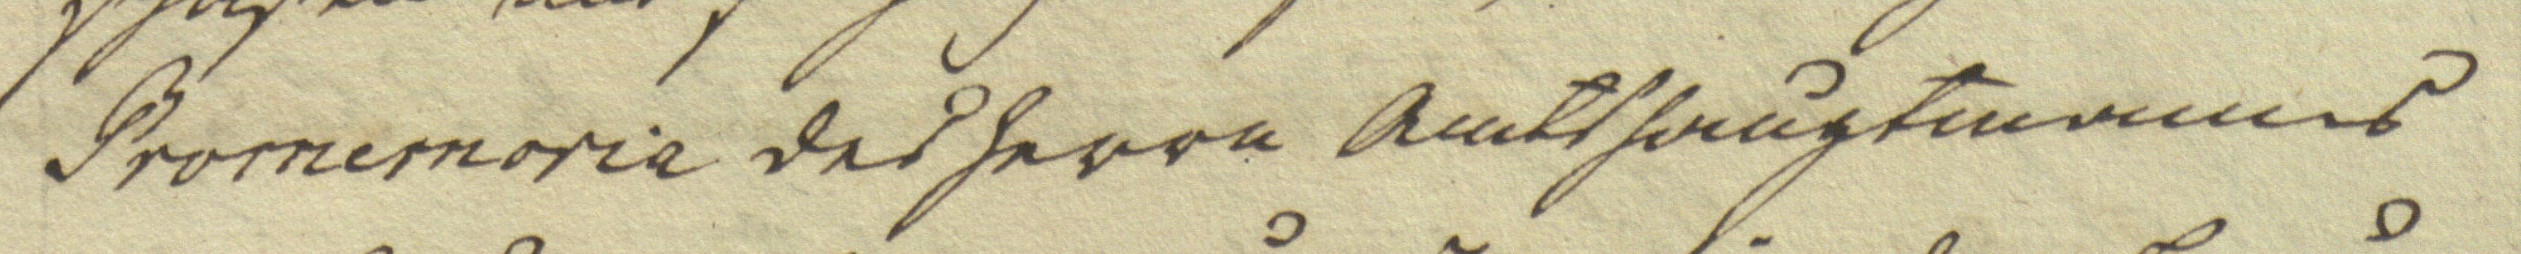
Promemoria des Herrn Amtshauptmanns
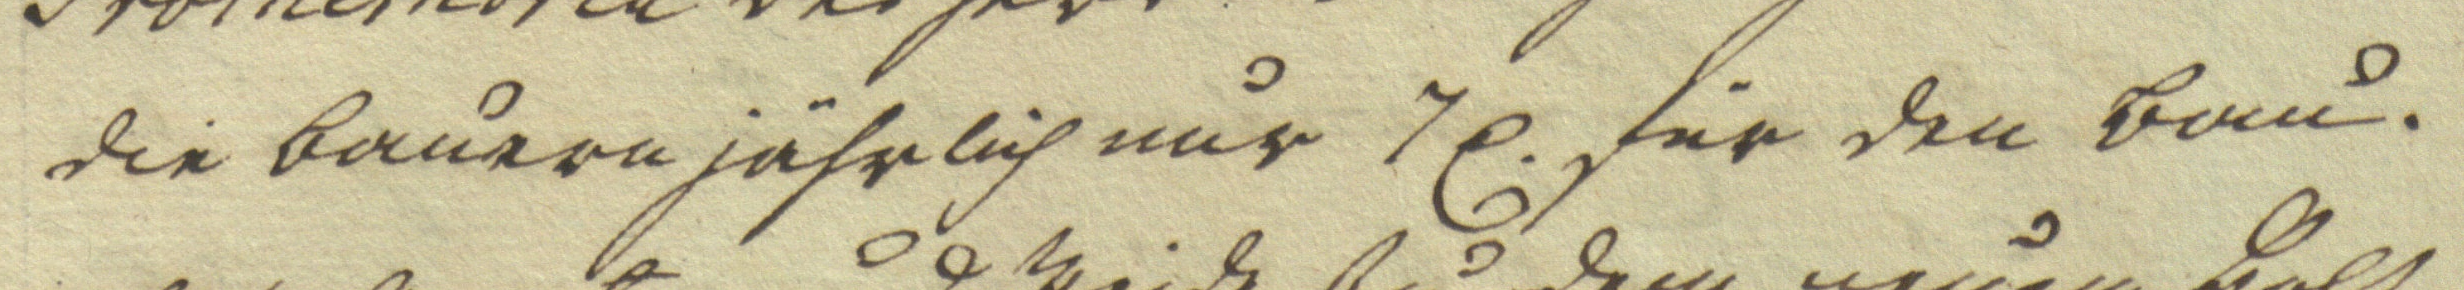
die Bauern jährlich nur 7 l. für den Bau¬
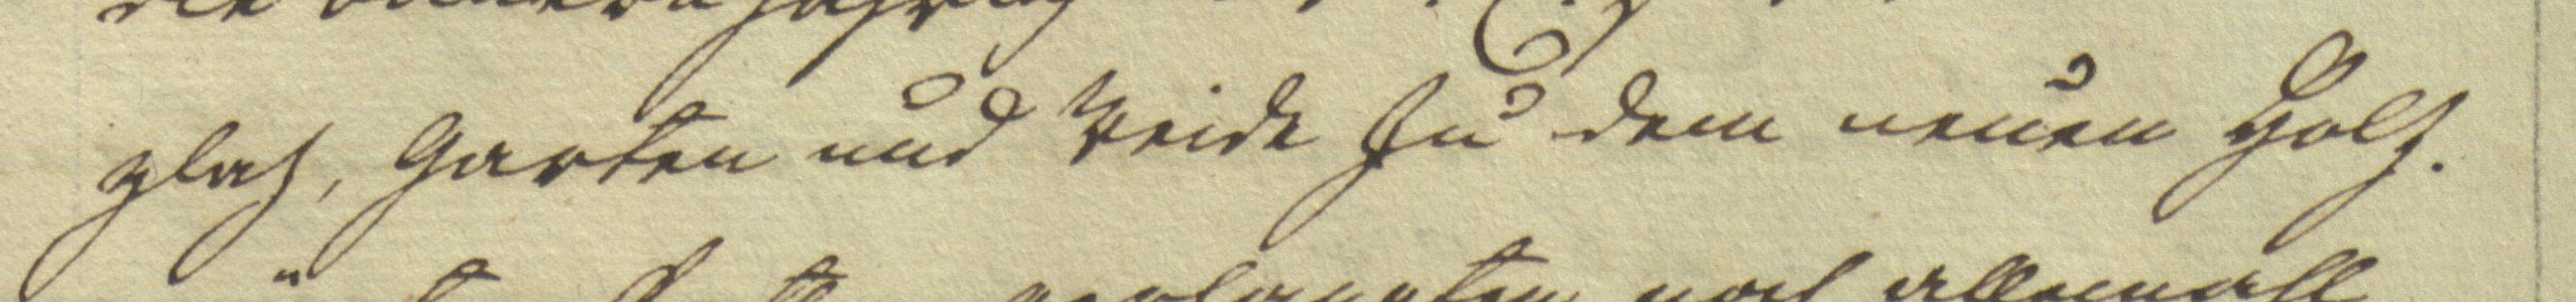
plaz, Garten und Weide zu dem neuen Holz¬
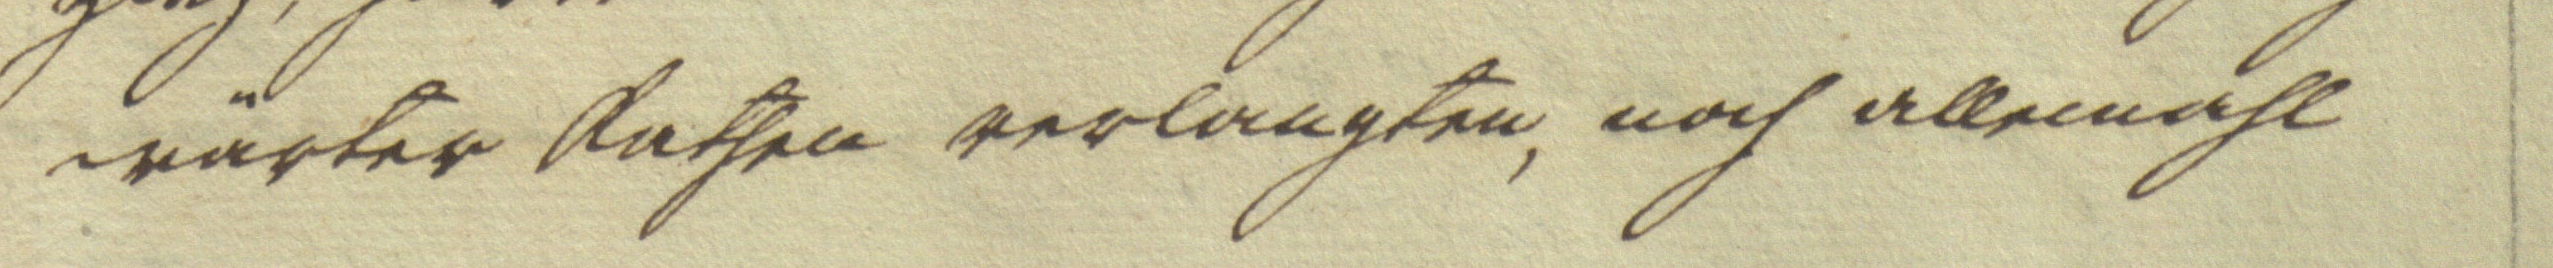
wärter Kathen verlangten, noch allemahl
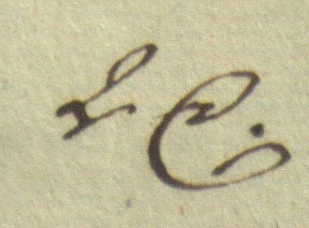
2 l.
